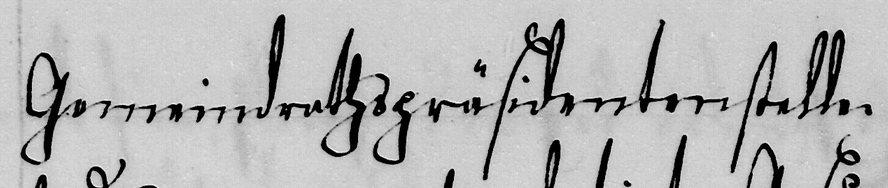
Gemeindrathspräsidentenstell¬
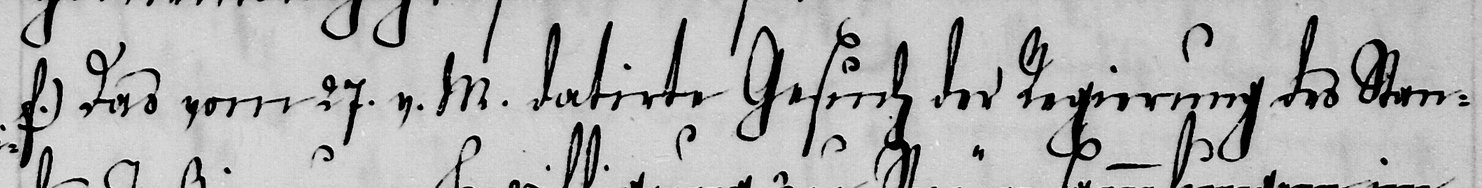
f.) Das vom 27. v. M. datirte Gesuch der Regierung des Stan¬
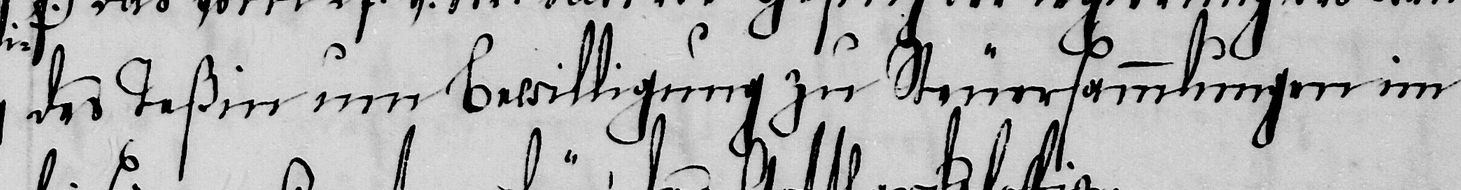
des Teßin um Bewilligung zu Steuersammlungen im
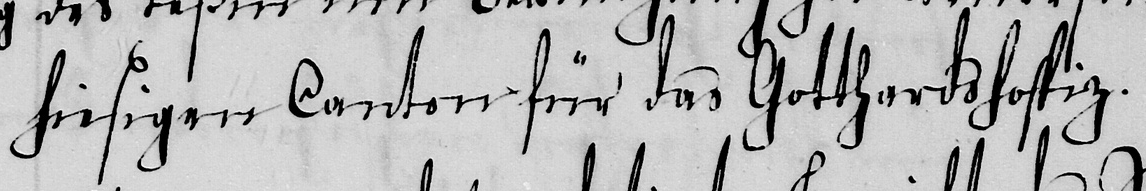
hiesigen Canton für das Gotthardshospiz.
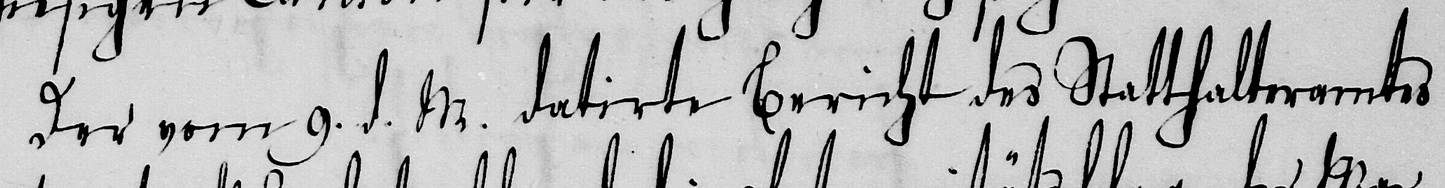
Der vom 9. d. M. datirte Bericht des Statthalteramtes
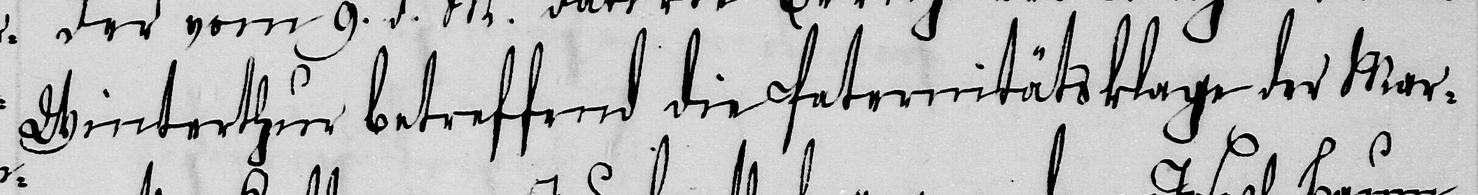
Winterthur betreffend die Paternitätsklage der Mar¬
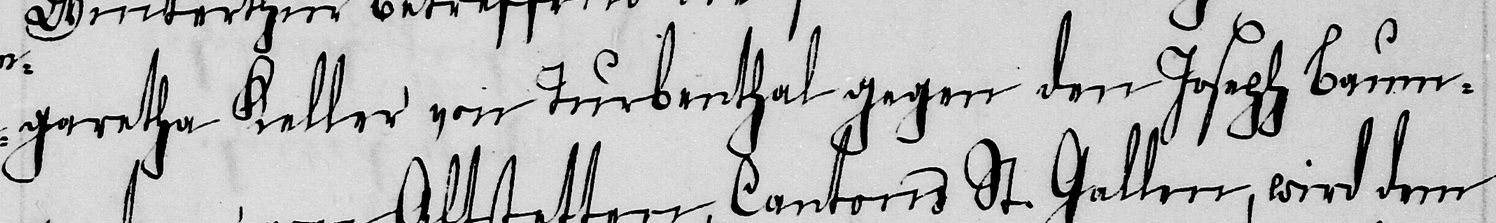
garetha Keller von Turbenthal gegen den Joseph Baum¬
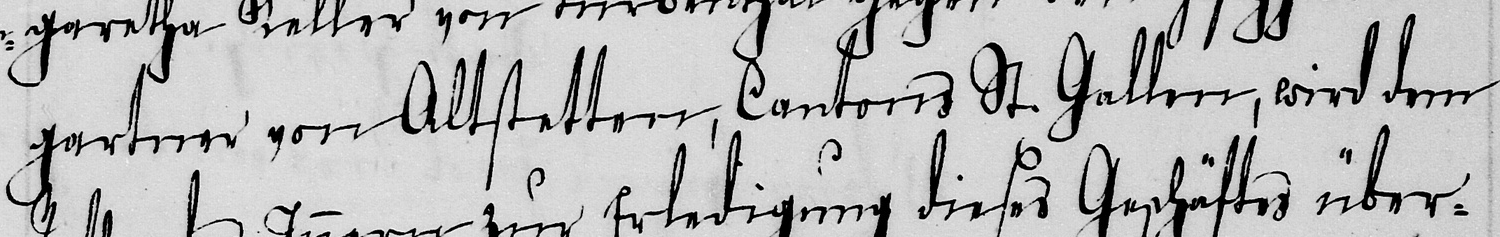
gartner von Altstetten, Cantons St. Gallen, wird dem
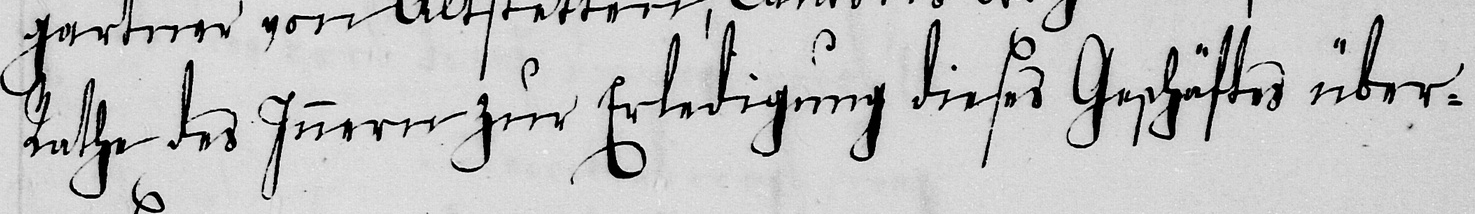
Rathe des Innern zur Erledigung dieses Geschäftes über¬
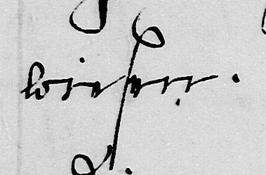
wiesen.
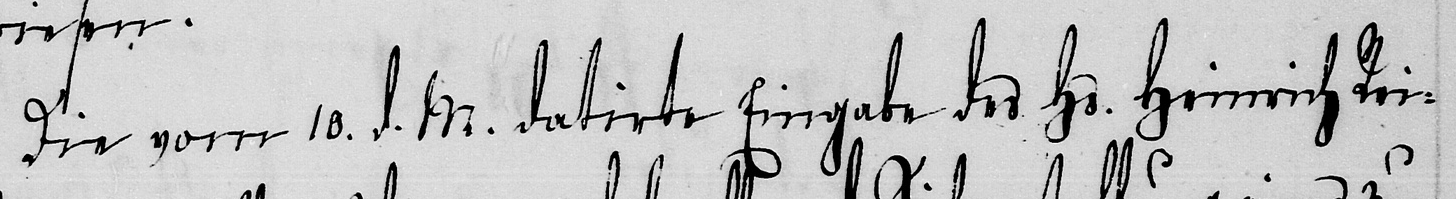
Die vom 10. d. M. datirte Eingabe des Hs. Heinrich Rei¬
